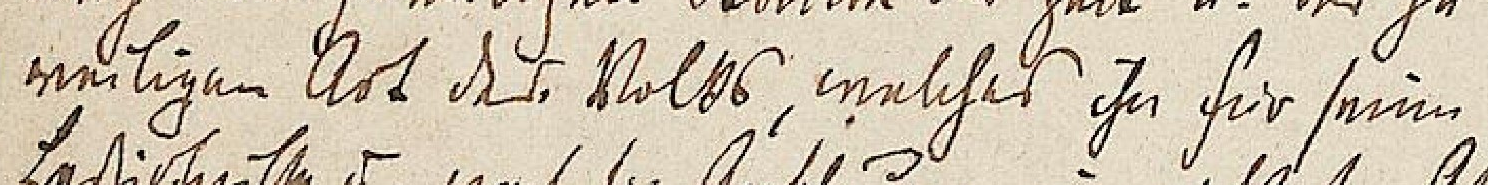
weiligen Art des Volks, welches ihn für seine
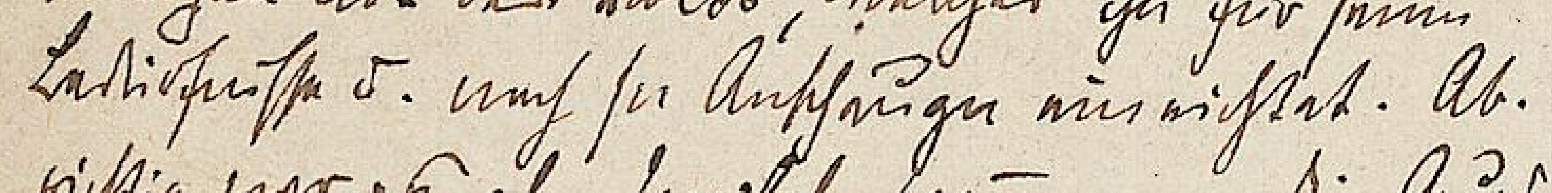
Bedürfnisse u. nach sn Anschaugn einrichtet. Ab.
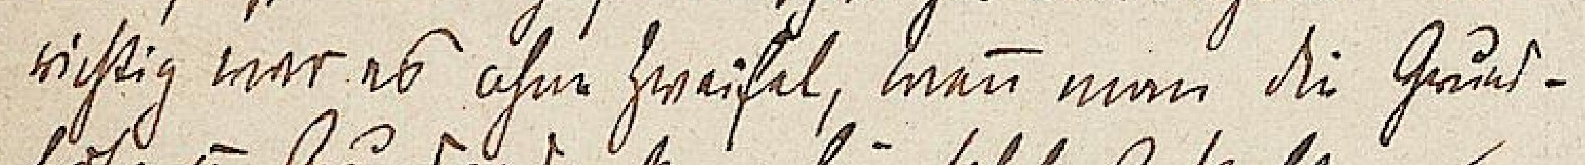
richtig war es ohne Zweifel, wen man die Grund¬
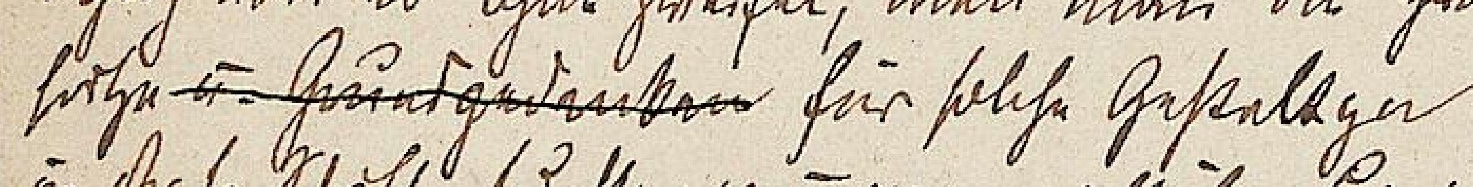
sätze u. Grundgedanken für solche Gestaltgn
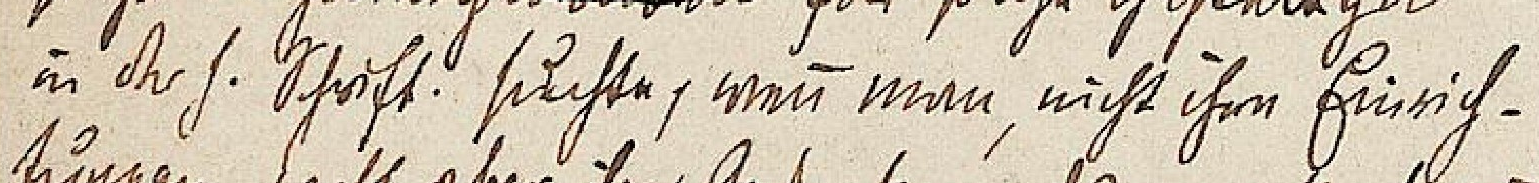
in der h. Schrift. suchte, wen man, nicht ihre Einrich¬
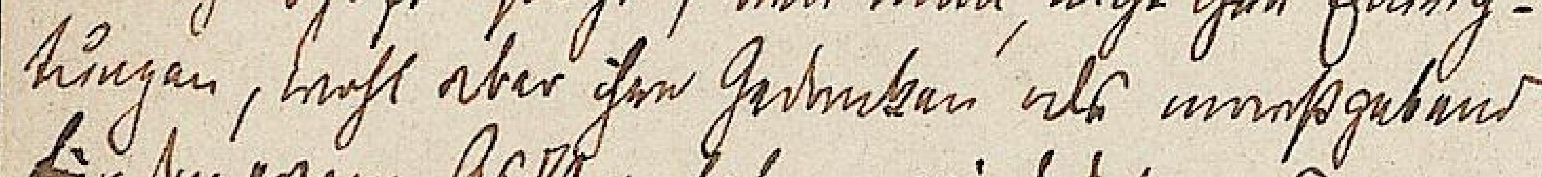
tungen, wohl aber ihre Gedanken als maaßgebend
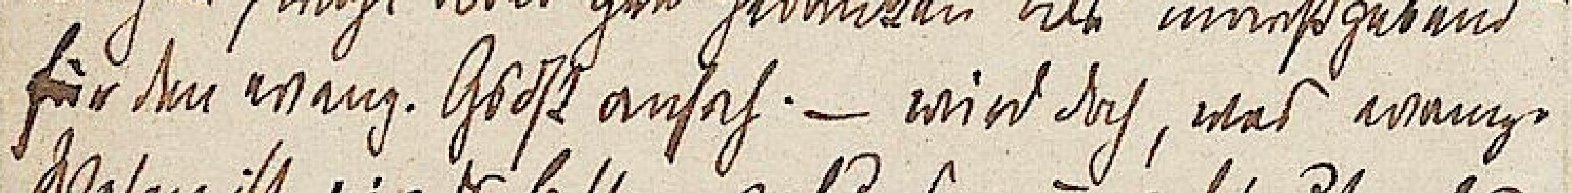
fur den evang. Gsdst ansah._ wird doch, was evang.
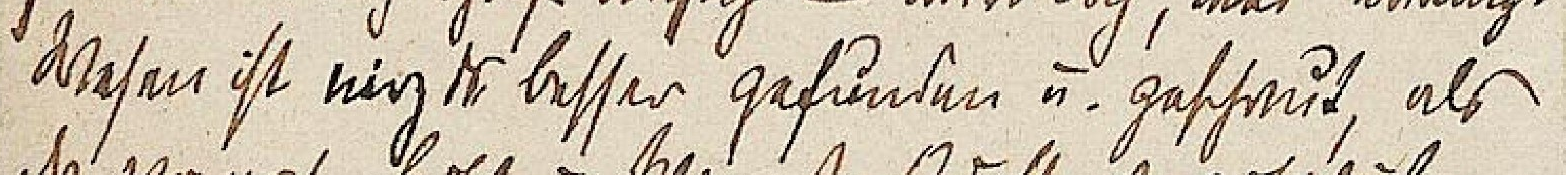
Wesen ist eig ds besser gefunden u. geschaut, als
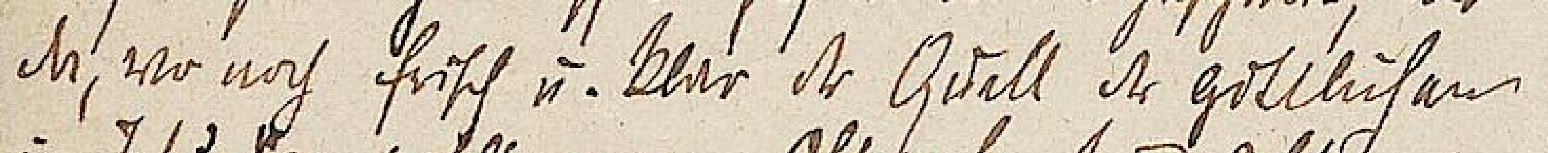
da, wo noch frisch u. klar der Quell der göttlichen
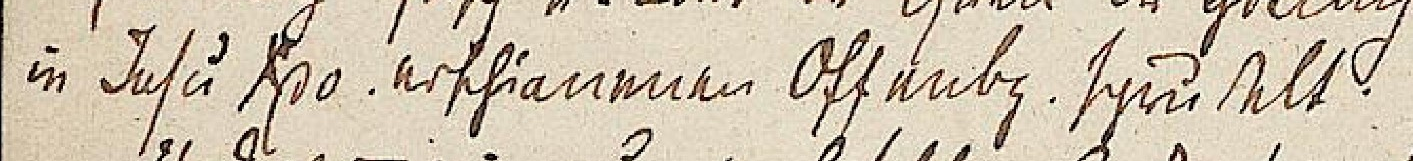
in Jesu Χρo erschienenen Offenbg. handelt.
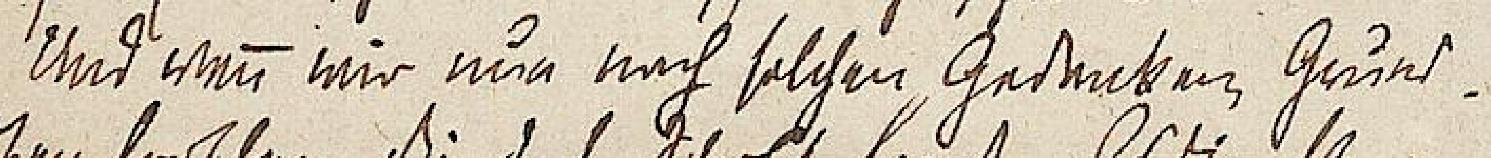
Und wen wir nun nach solchen Gedanken Grund¬
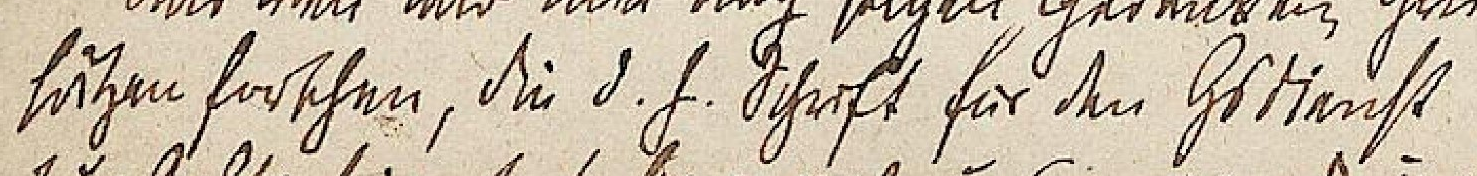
sätzen forschen, die d. h. Schrift für den Gsdienst
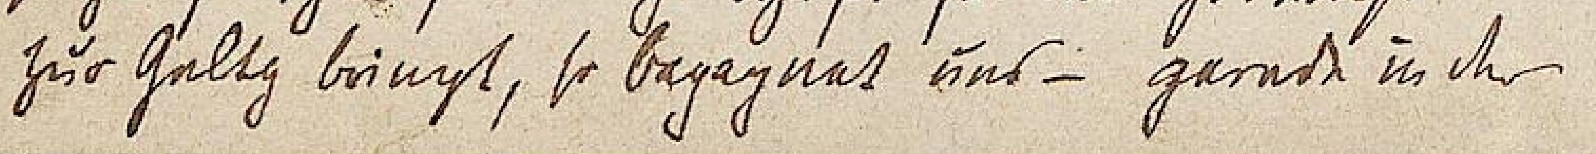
zur Geltg bringt, so begegnet uns - gerade in der
